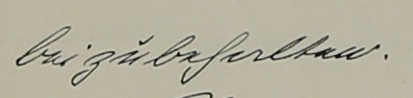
beizubehalten.
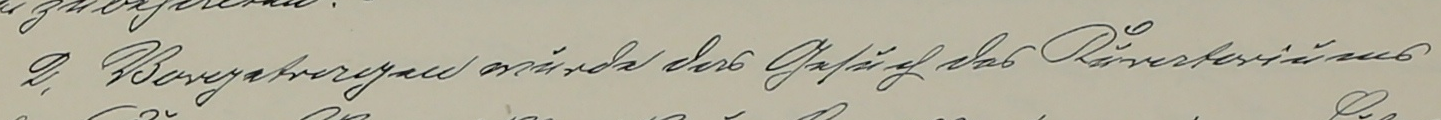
2. Vorgetragen wurde das Gesuch des Kuratoriums
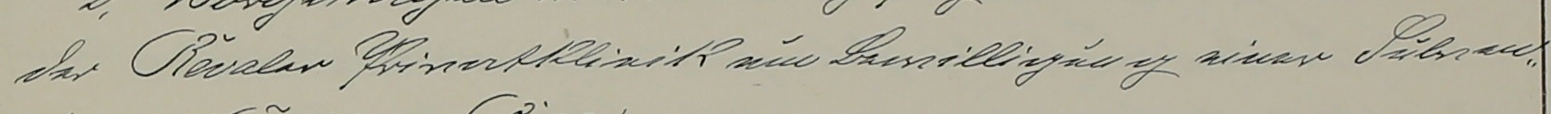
der Revaler Privatklinik um Bewilligung einer Subven-
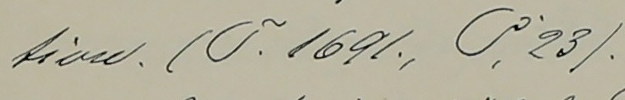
tion. (T.1691., P.23).
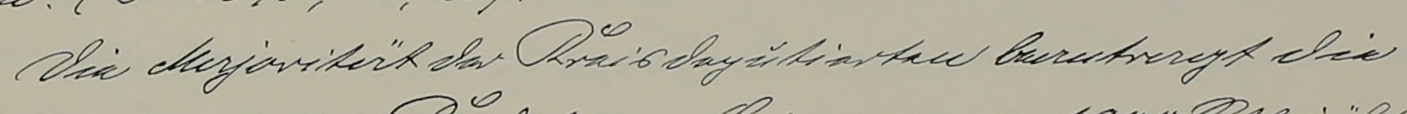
Die Majorität der Kreisdeputierten beantragt die
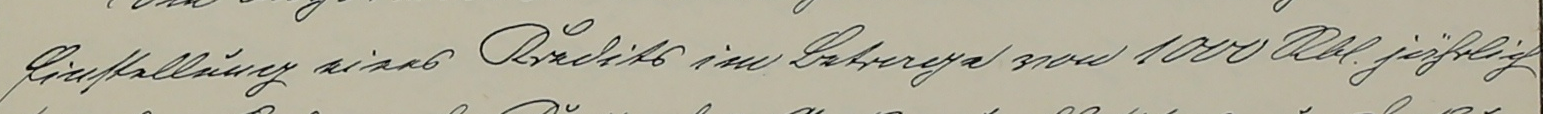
Einstellung eines Kredits im Betrage von 1000 Rbl. jährlich
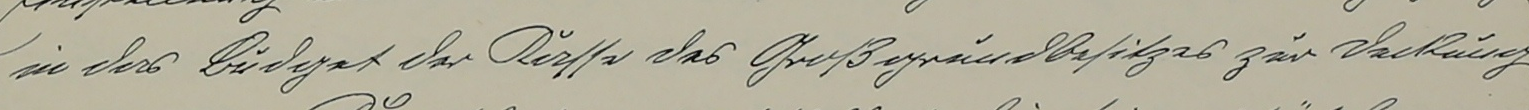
in das Budget der Kasse des Großgrundbesitzes zur Deckung
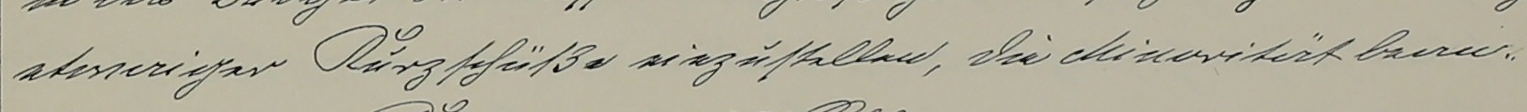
etwaiger Kurzschüße einzustellen, die Minorität bean-
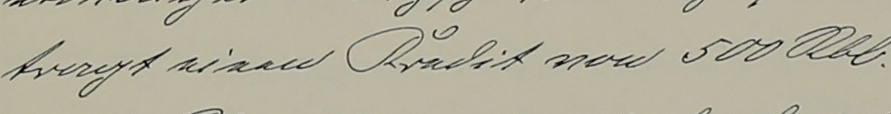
tragt einen Kredit von 500 Rbl.
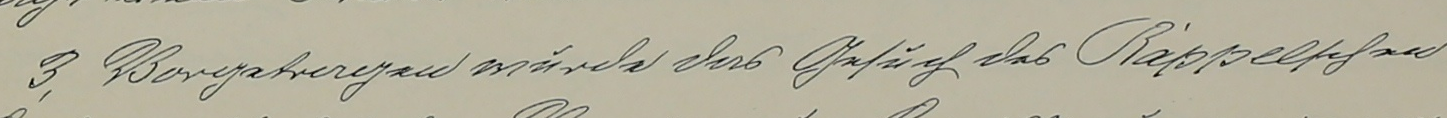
3. Vorgetragen wurde das Gesuch des Rappelschen
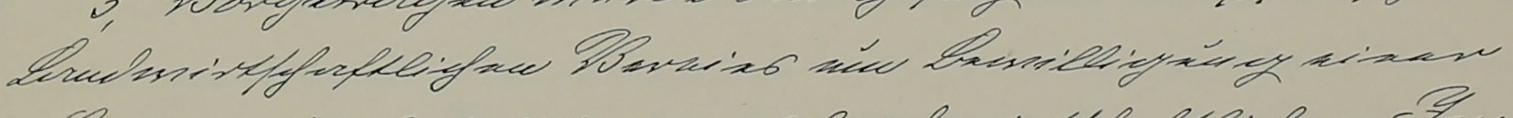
Landwirtschaftlichen Vereins um Bewilligung einer
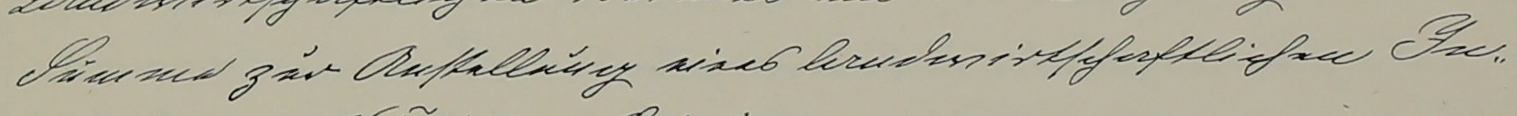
Summe zur Anstellung eines landwirtschaftlichen In-
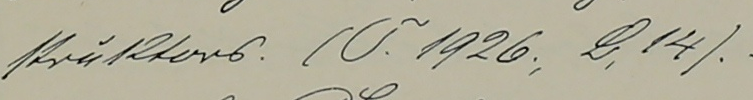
struktors. (T.1926., L.14).
